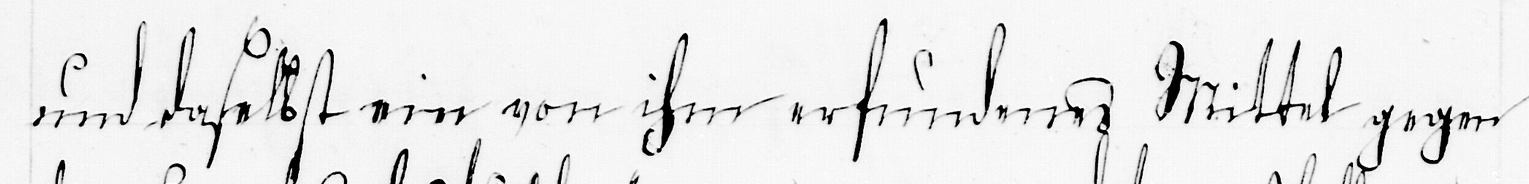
und daselbst ein von ihm erfundenes Mittel gegen
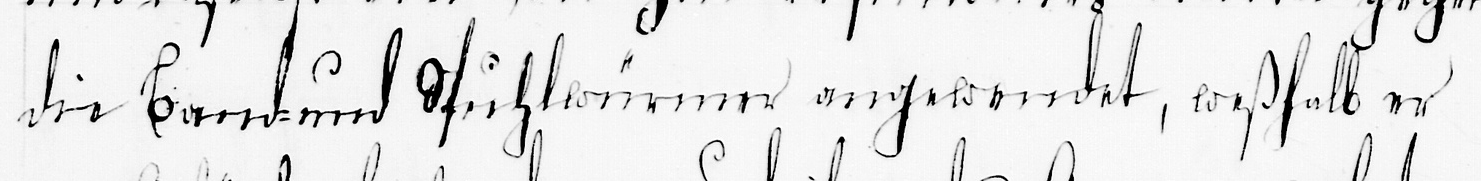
die Band- und Spuhlwürmer angewendet, weßhalb er
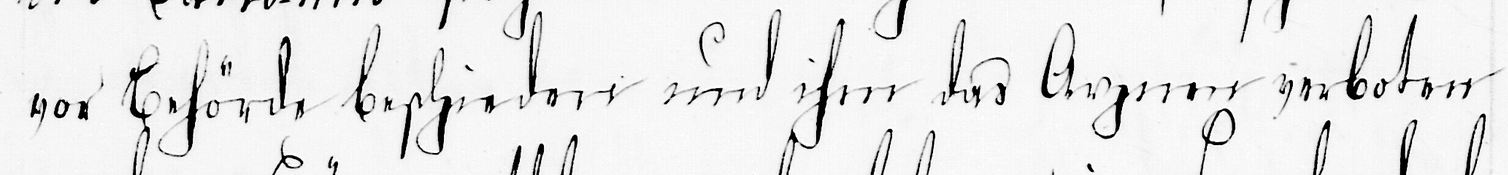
vor Behörde beschieden und ihm das Arznen verboten
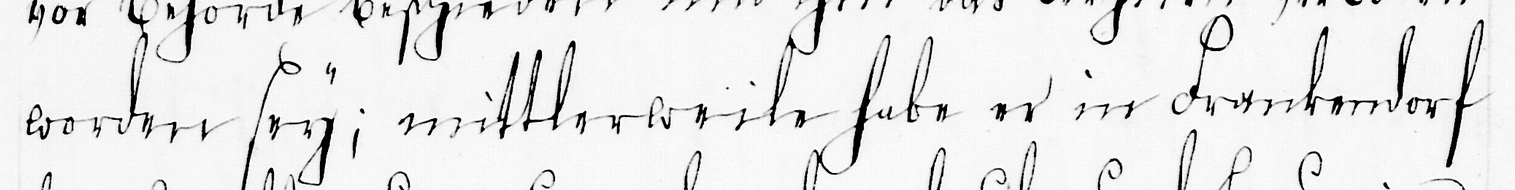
worden sey; mittlerweile habe er in Frankendorf
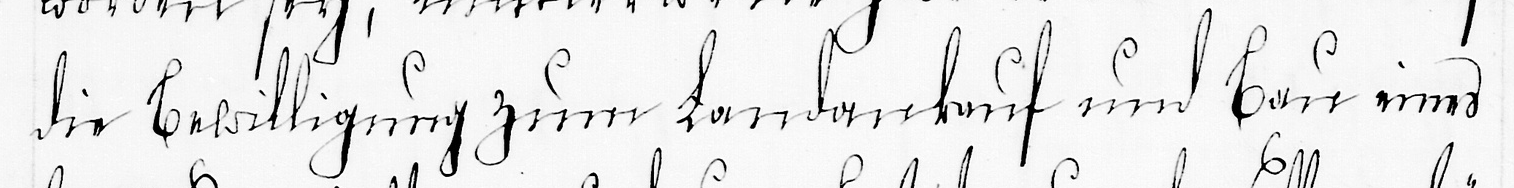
die Bewilligung zum Landankauf und Bau eines
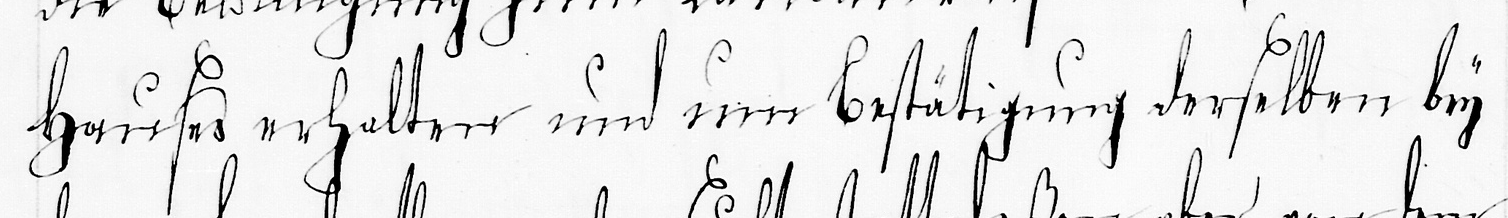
Hauses erhalten und um Bestätigung derselben bey
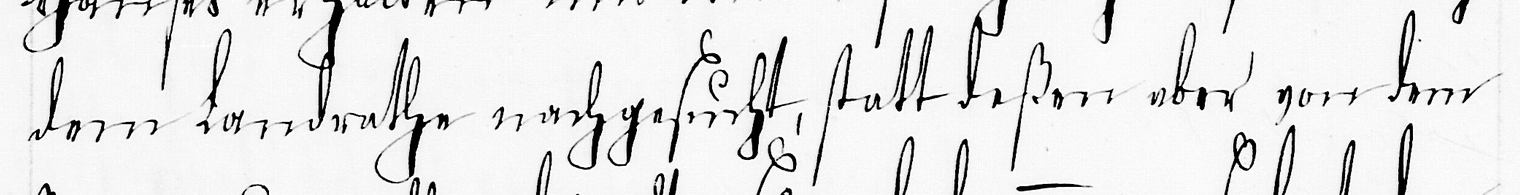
dem Landrathe nachgesucht, statt deßen aber von dem
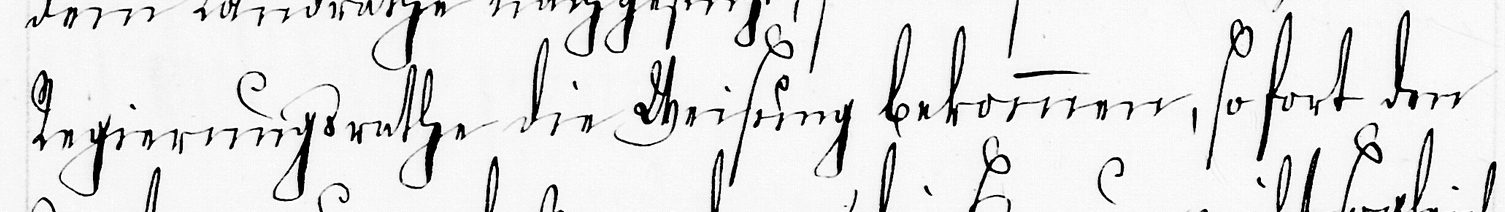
Regierungsrathe die Weisung bekommen, sofort den
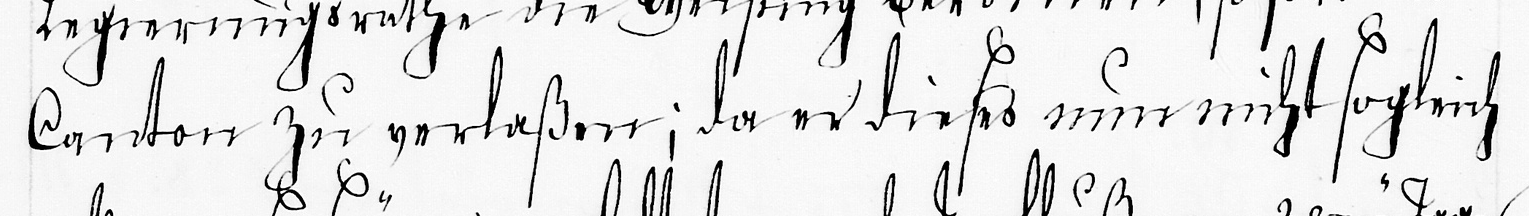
Canton zu verlaßen; da er dieses nun nicht sogleich
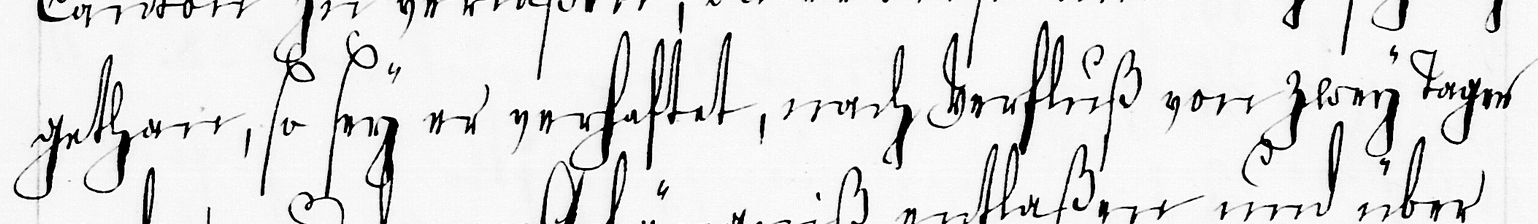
gethan, so sey er verhaftet, nach Verfluß von zwey Tagen
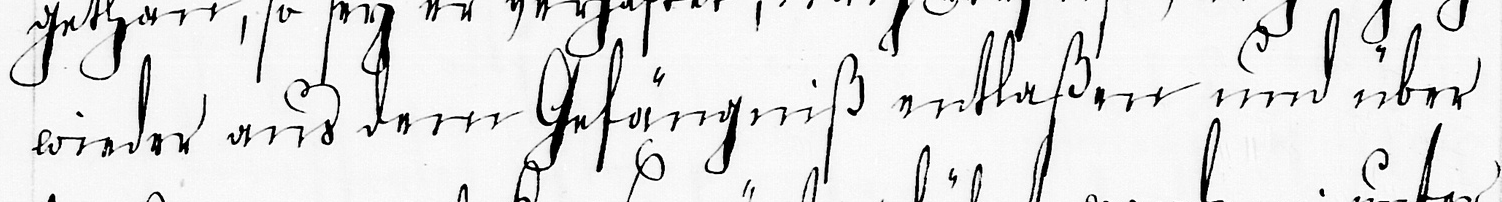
wieder aus dem Gefängniß entlaßen und über
